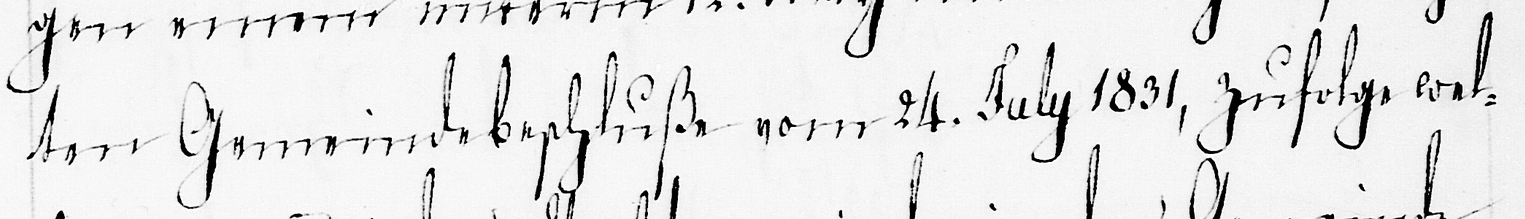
ten Gemeindebeschluße vom 24. July 1831, zufolge wel¬
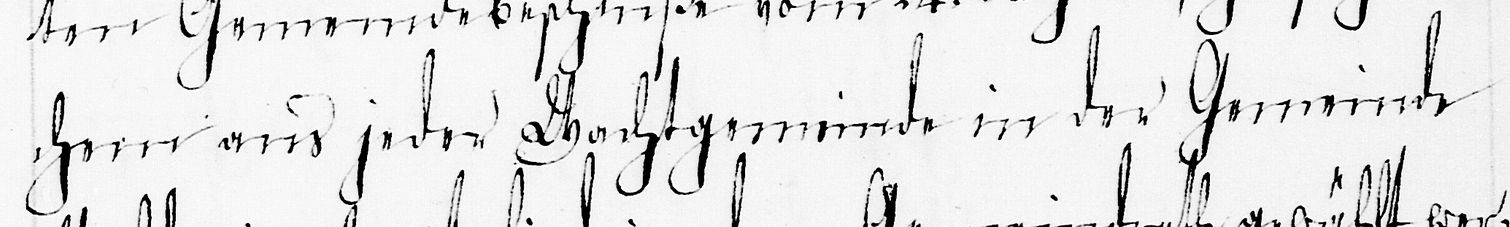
chem aus jeder Wachtgemeinde in der Gemeinde
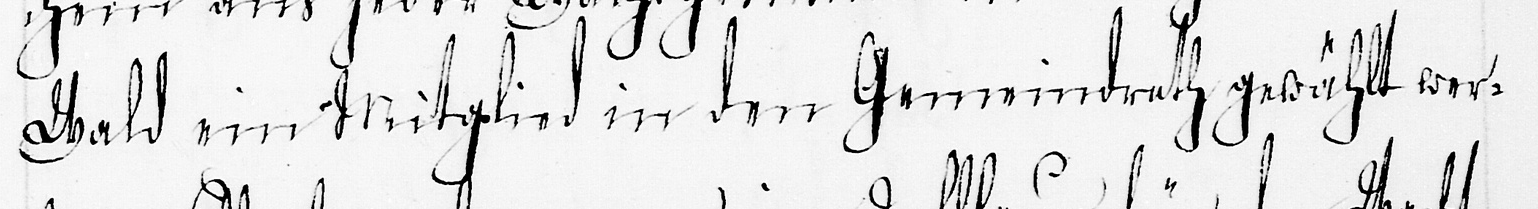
Wald ein Mitglied in den Gemeindrath gewählt wer¬
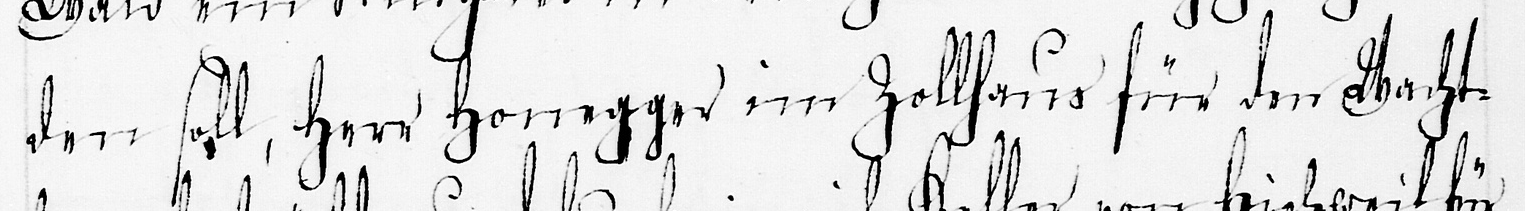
den soll, Herr Honegger im Zollhaus für den Wacht¬
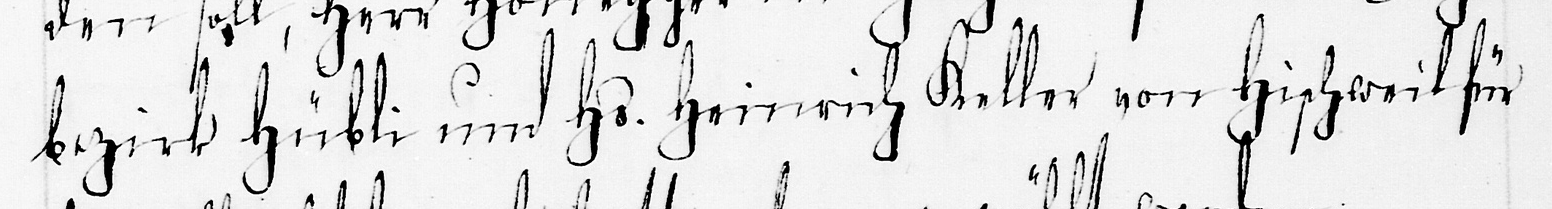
bezirk Hübli und Hs. Heinrich Keller von Hischweil für
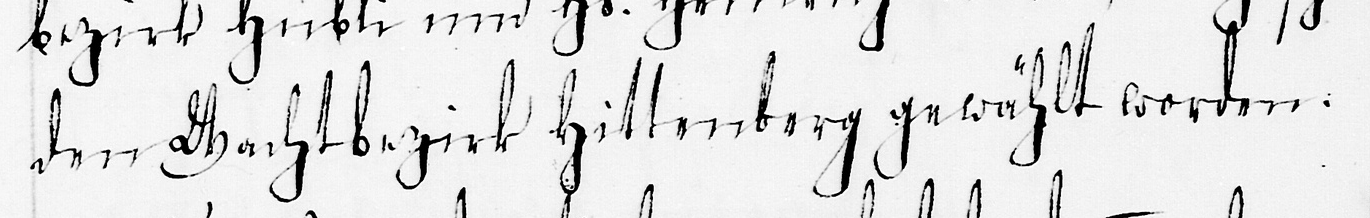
den Wachtbezirk Hittenberg gewählt worden.
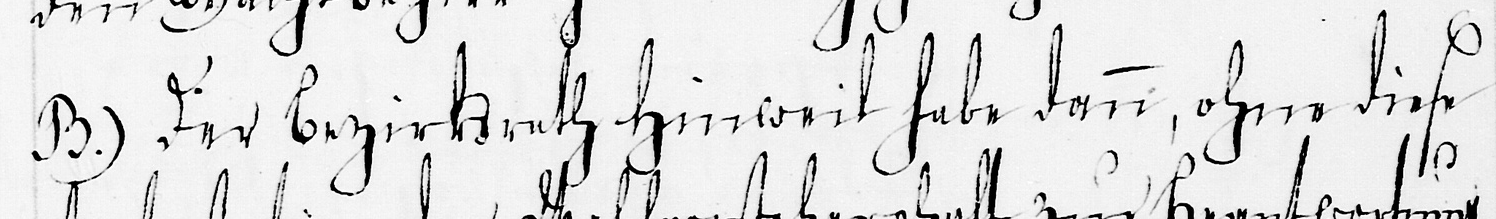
B.) Der Bezirksrath Hinweil habe dann, ohne diese
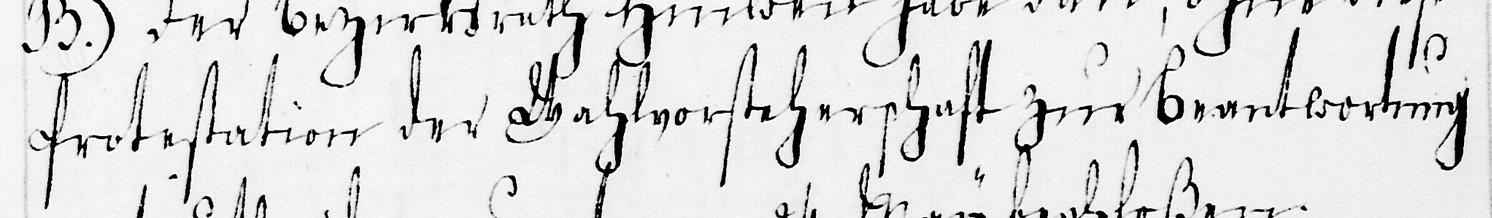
Protestation der Wahlvorsteherschaft zur Beantwortung
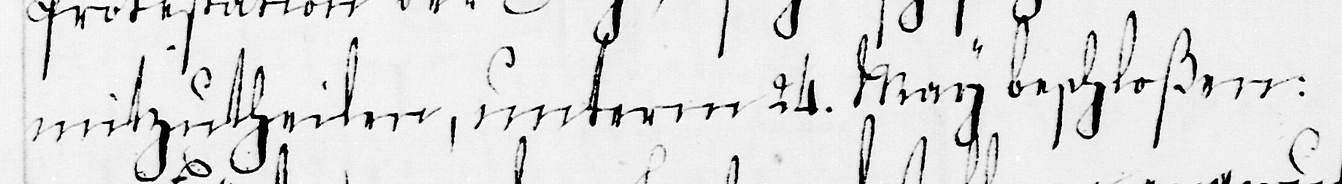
mitzutheilen, unterm 24. May beschloßen:
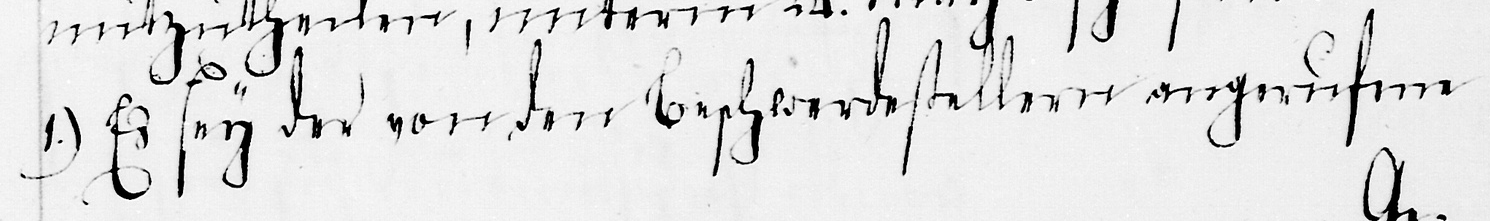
1.) Es sey der von den Beschwerdestellern angerufene
